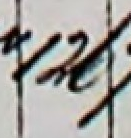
126
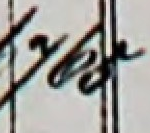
765
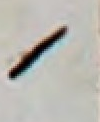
1
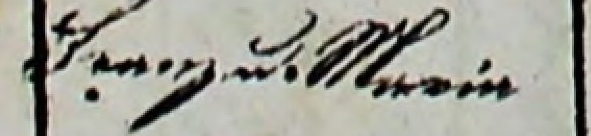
Franz u. Maria
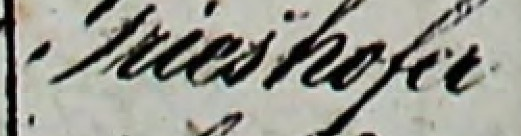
Grieshofer
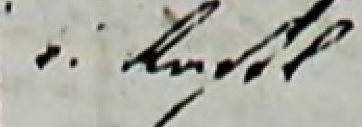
v. Rafel
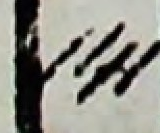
141
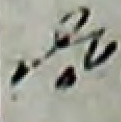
do
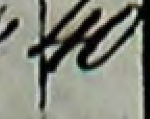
40
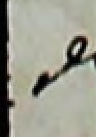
do
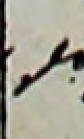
do
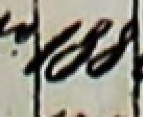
188
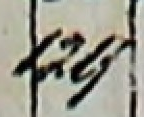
129
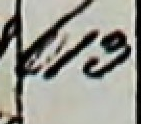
613
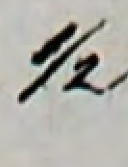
1/2
